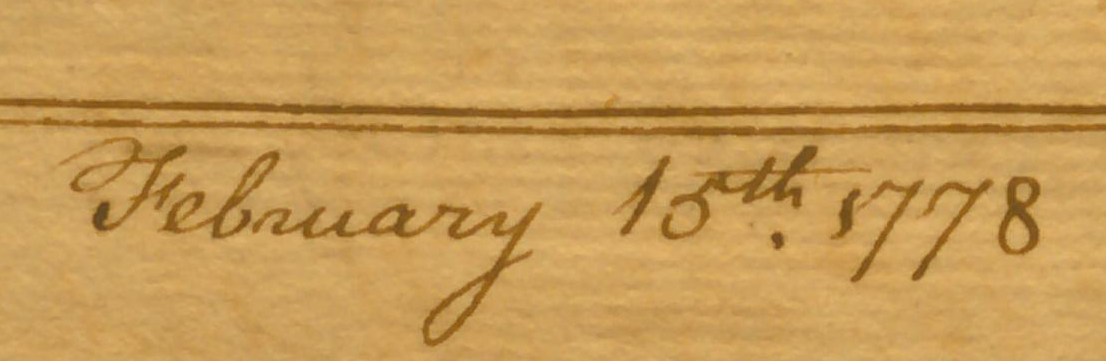February 15^th. 1778
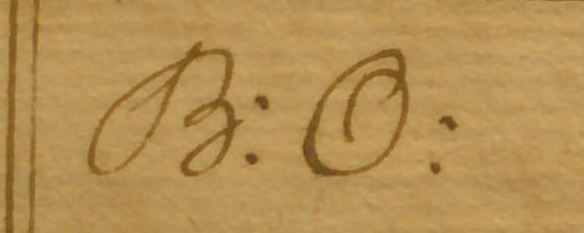B: O:
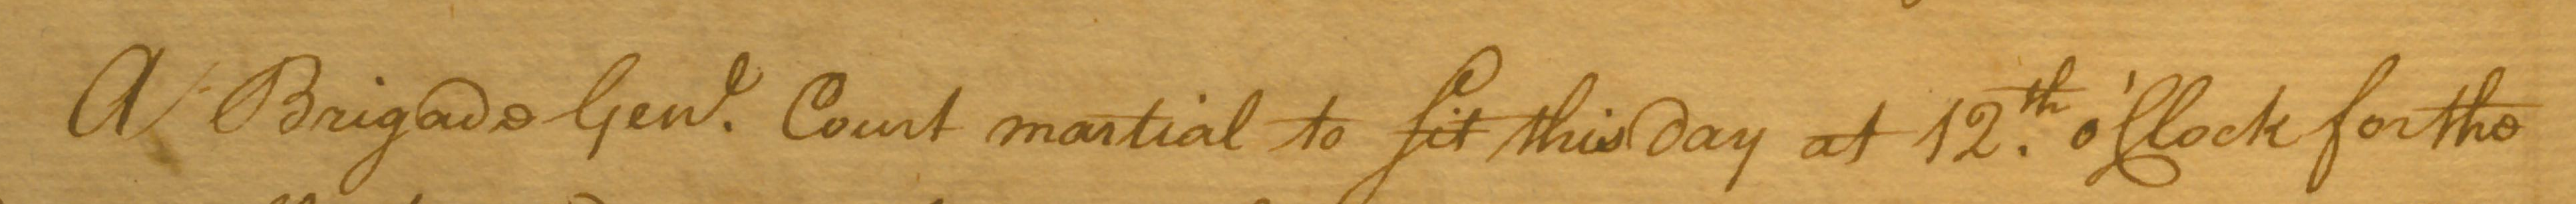A Brigade Gen^l. Court martial to sit this day at 12^th. o'Clock for the
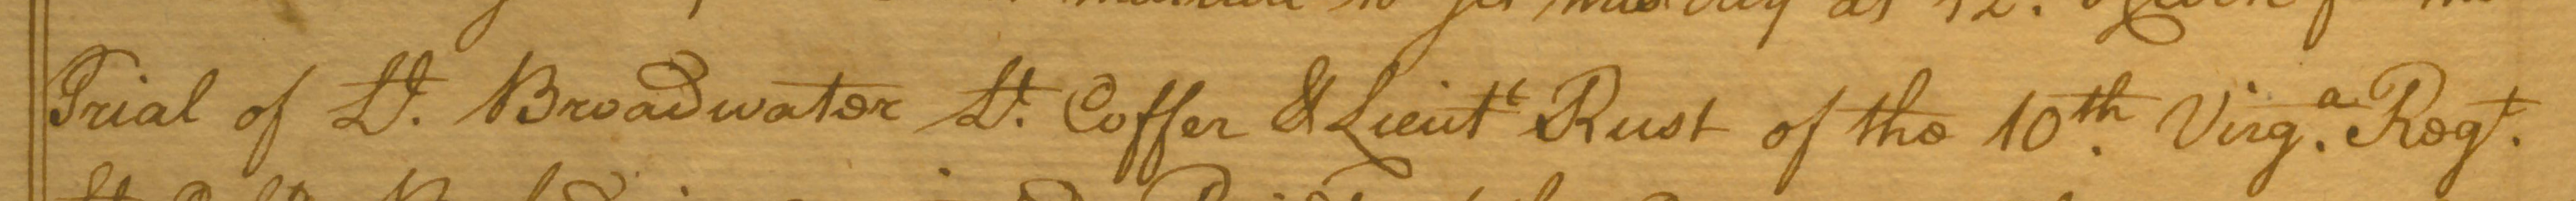Trial of L^t. Broadwater L^t. Coffer & Lieut^t. Rust of the 10^th. Virg^a. Reg^t.
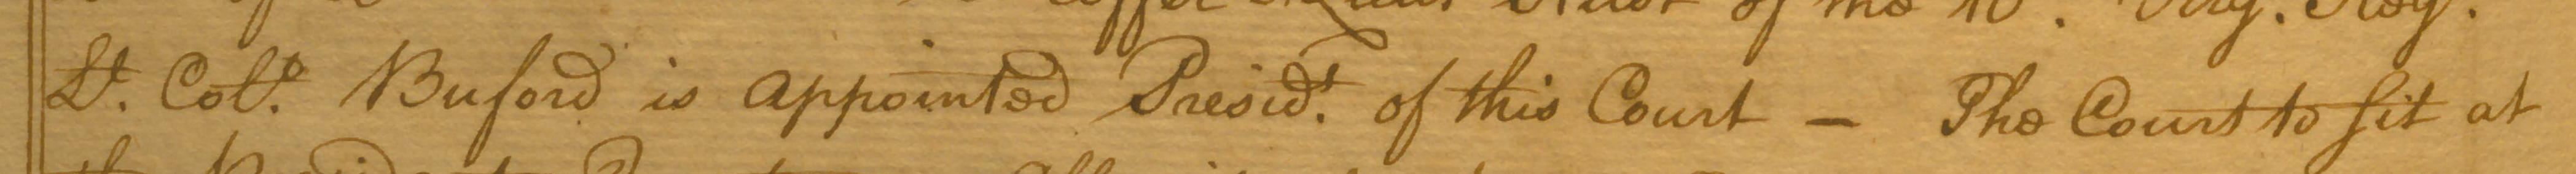L^t. Col^o. Buford is appointed Presid^t. of this Court- The Court to sit at
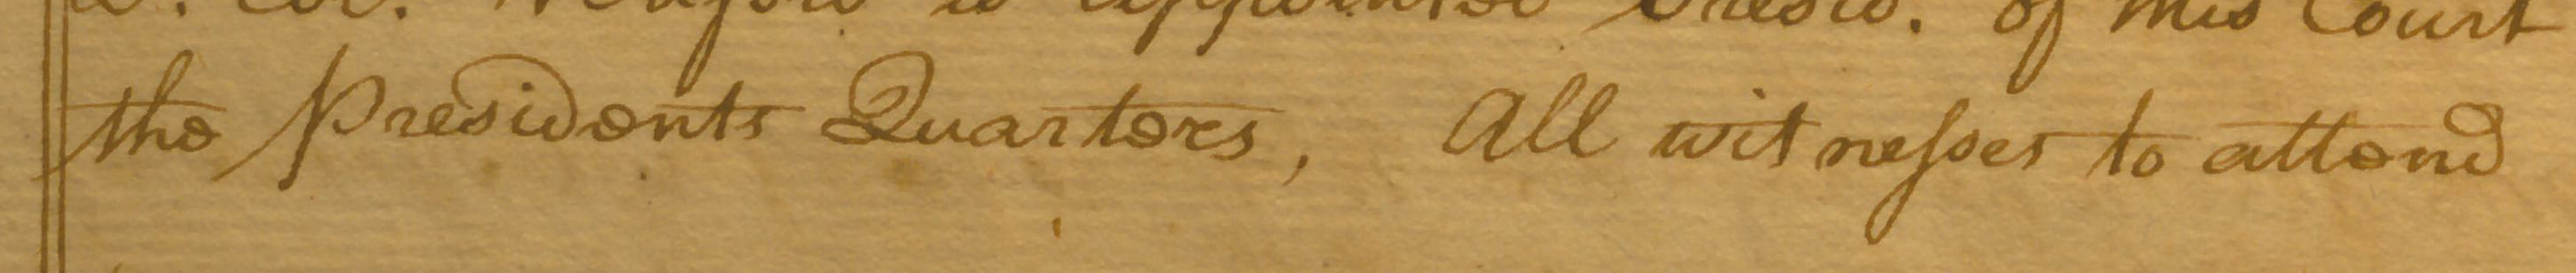the presidents Quarters. All witnesses to attend
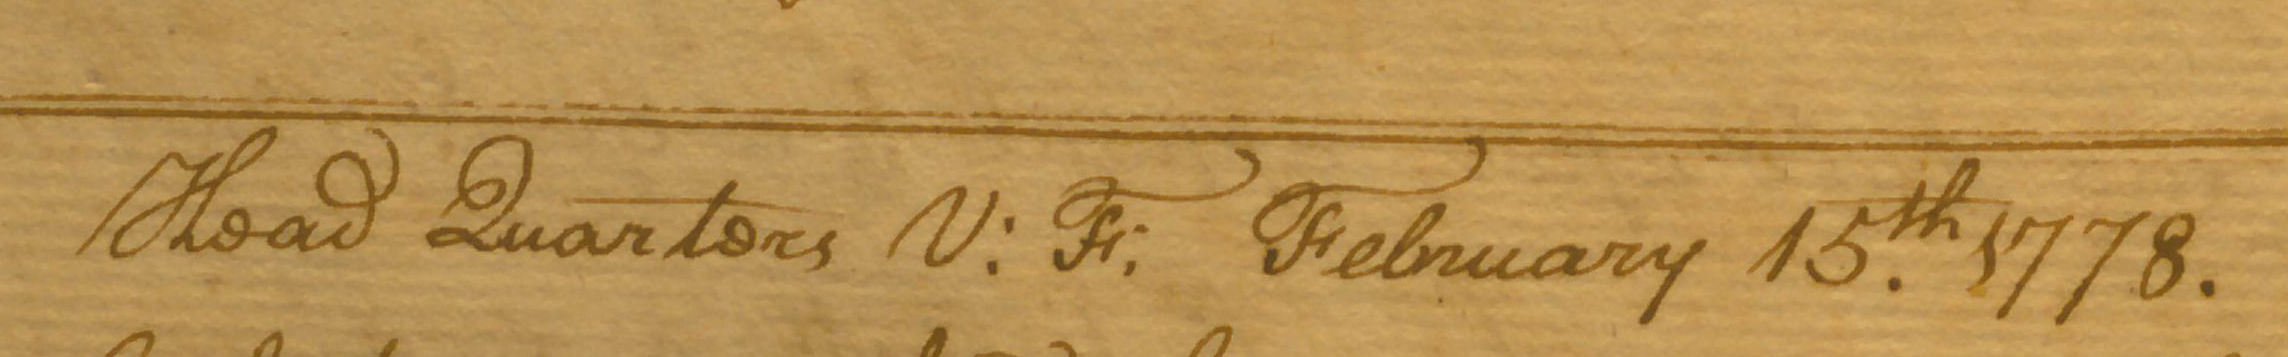Head Quarters V: F: February 15^th. 1778.
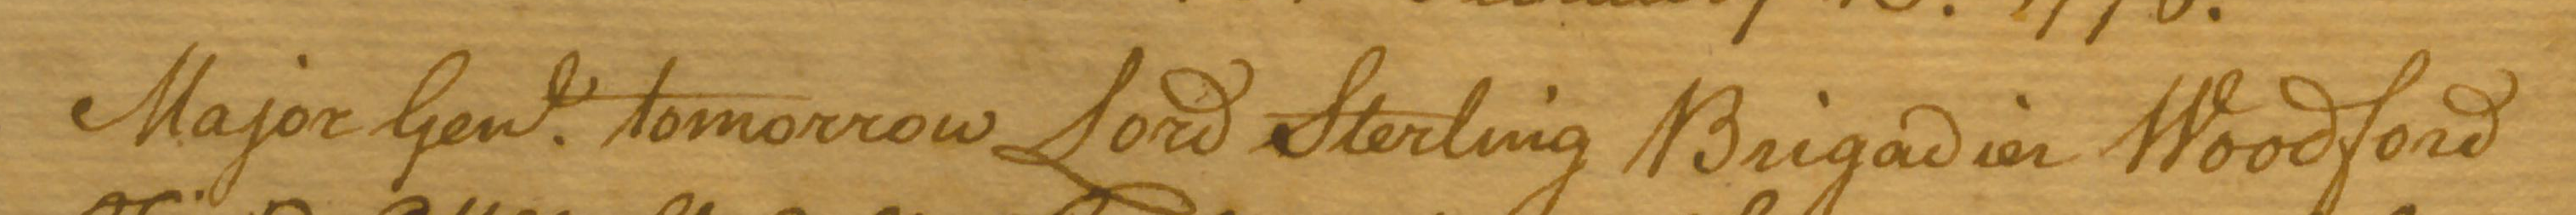Major Gen^l. tomorrow Lord Sterling Brigadier Woodford
